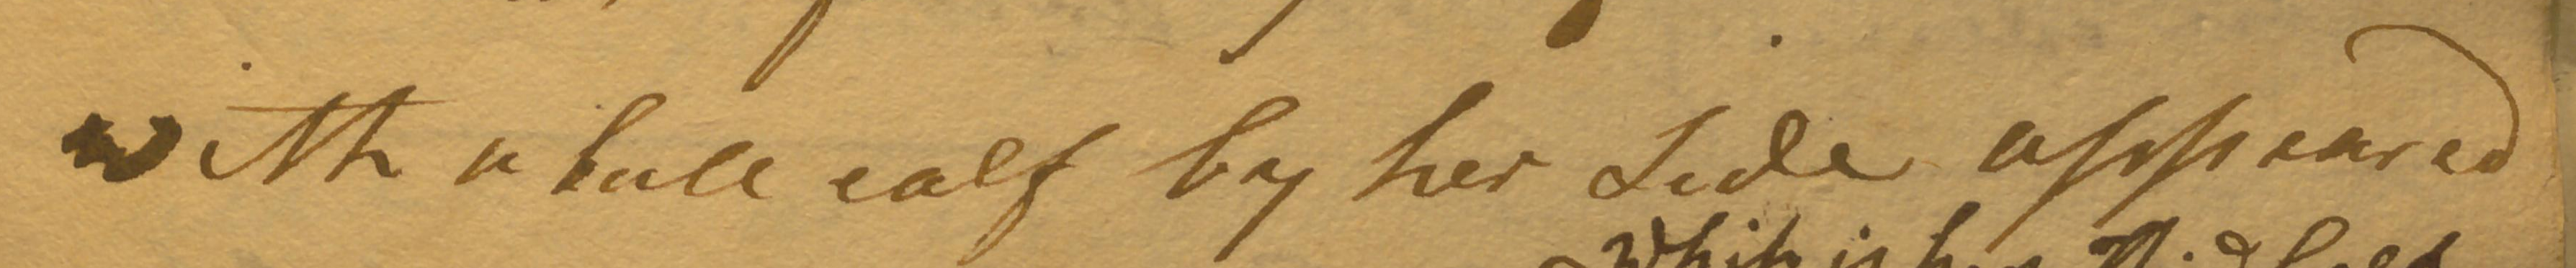with a bull calf by her side appeared
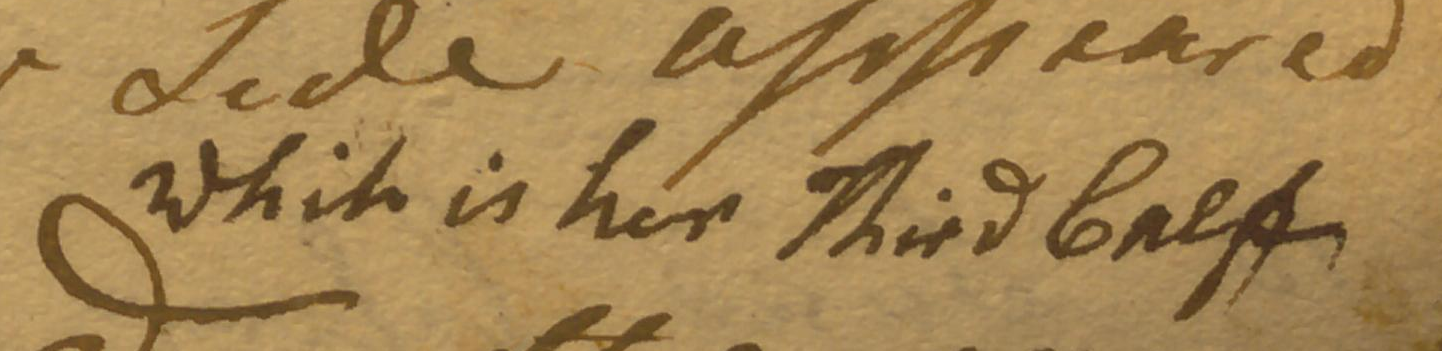which is her Third Calf
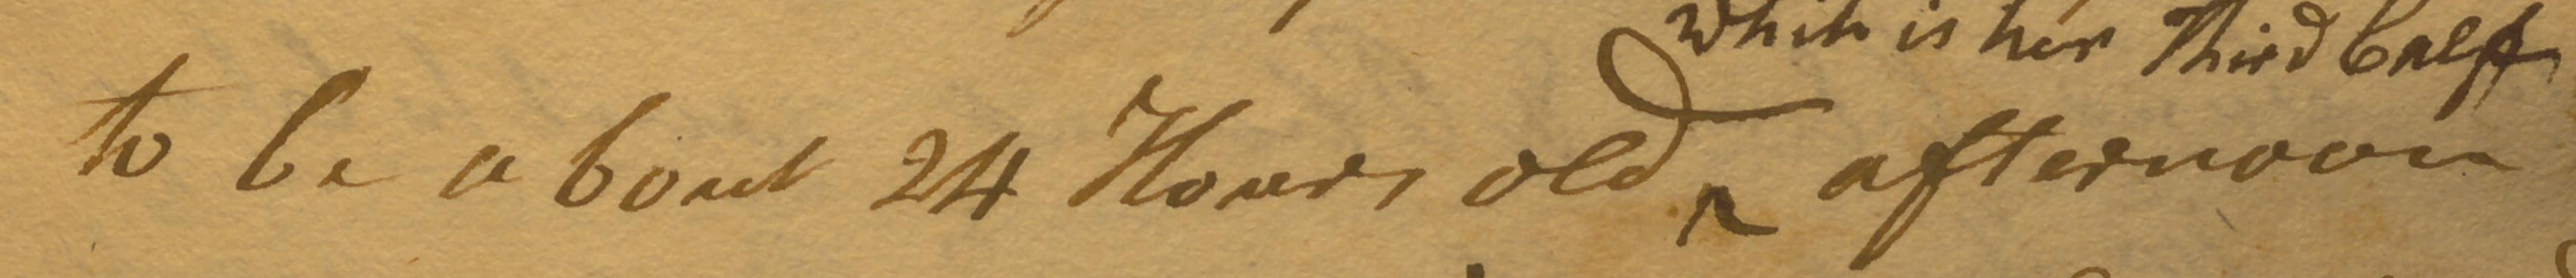to be about 24 Hours old ^ afternoon
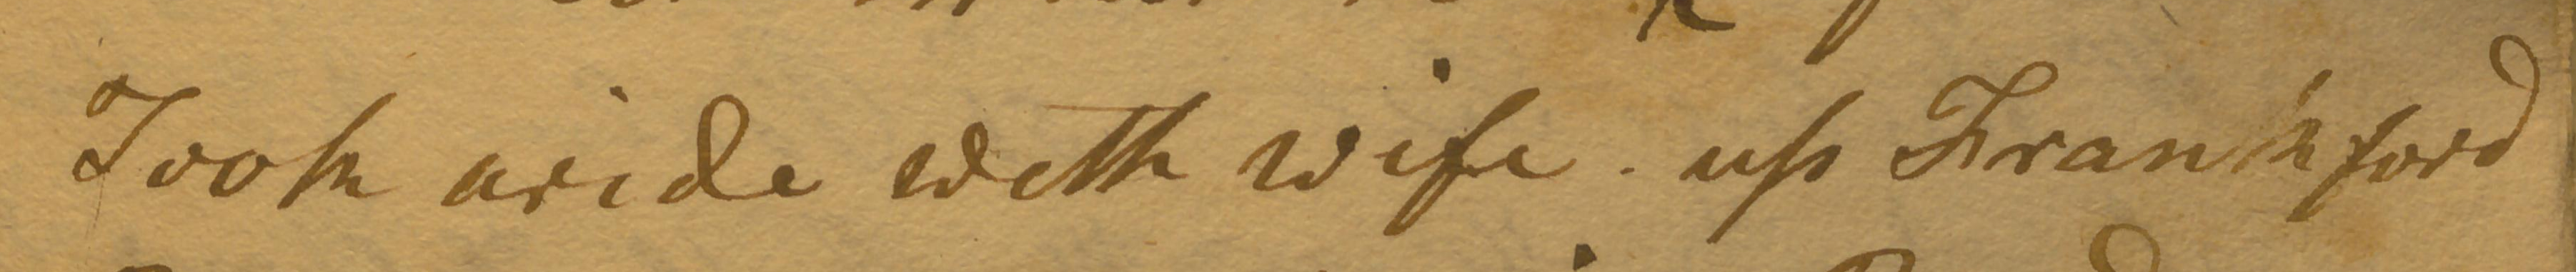Took a ride with wife up Frankford
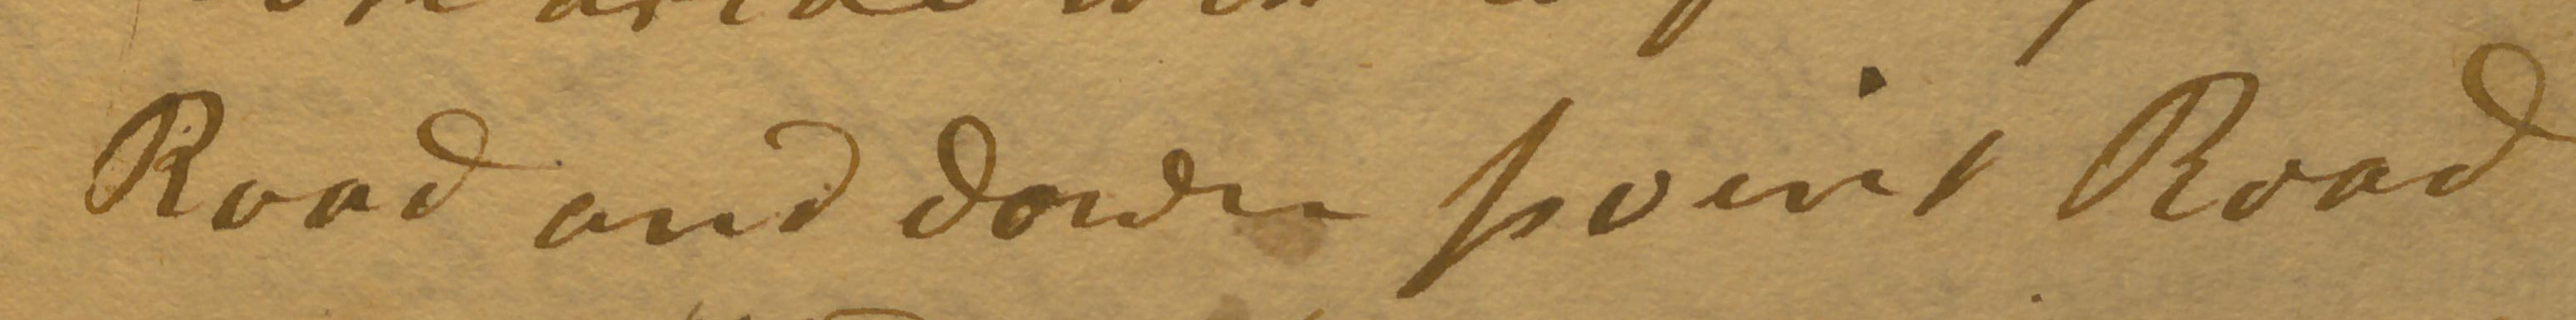Road and down point Road
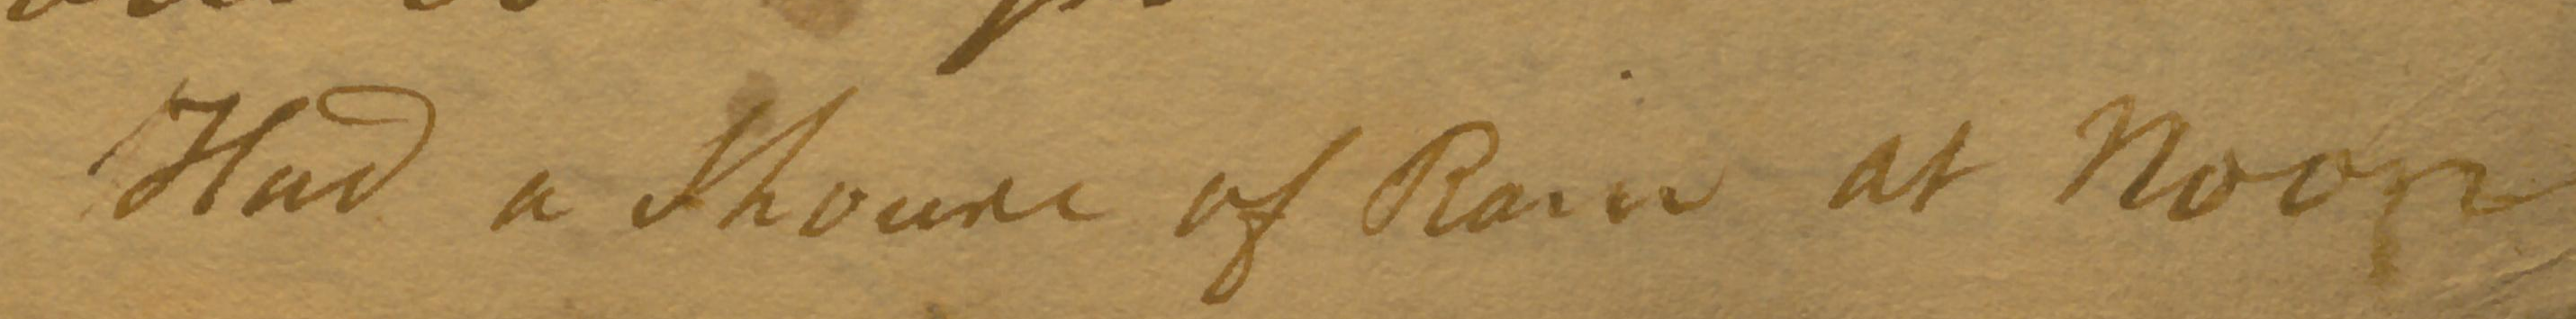Had a Shoure of Rain at Noon
